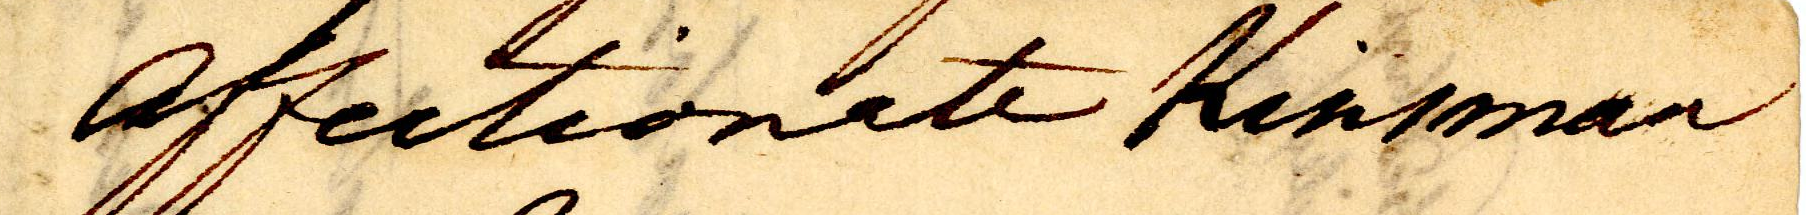Affectionate Kinsman
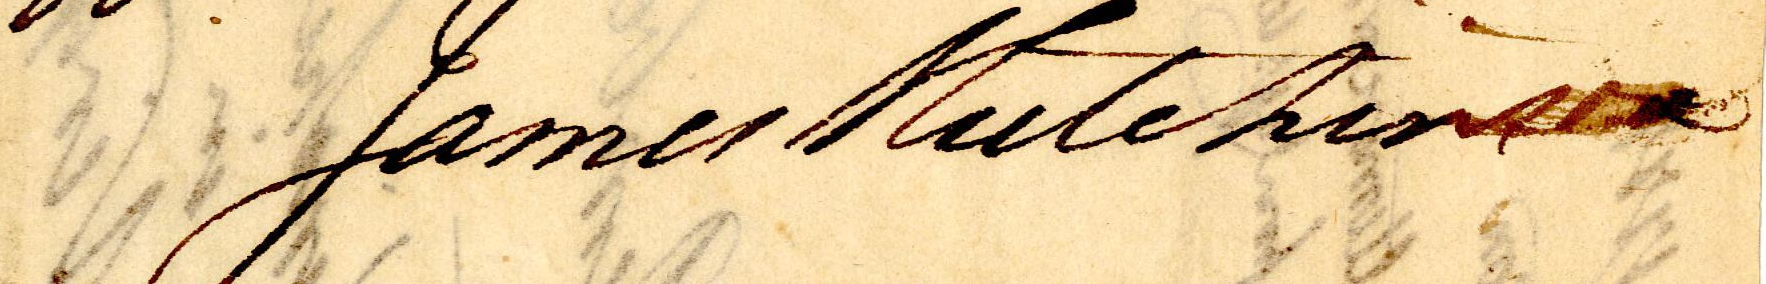James Hutchinson
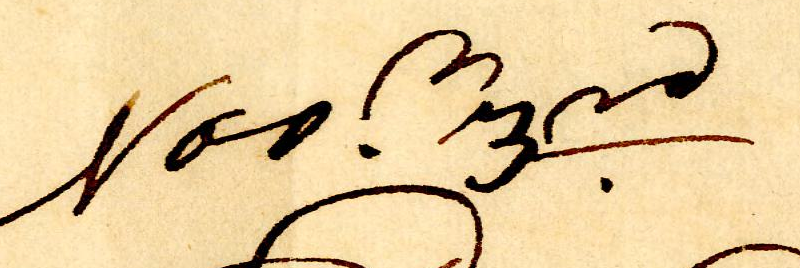Nov^r. 3^rd.
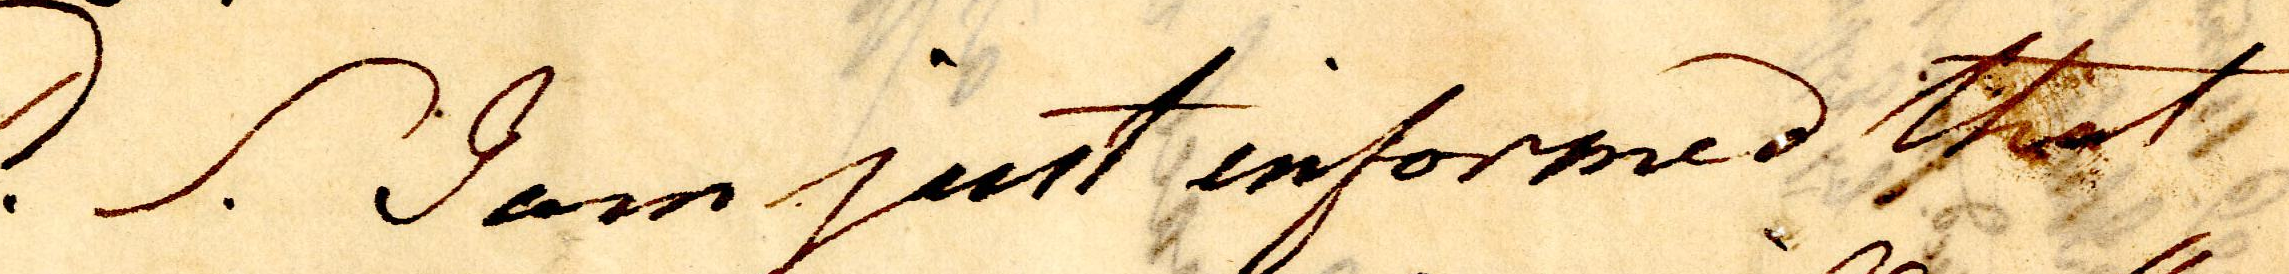I am just informed that
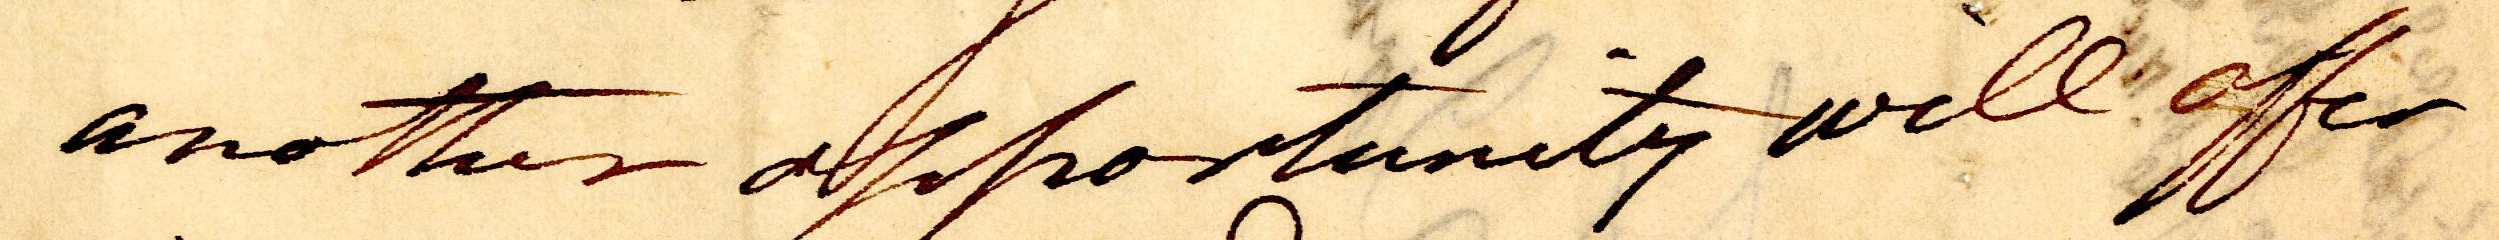another opportunity will offer
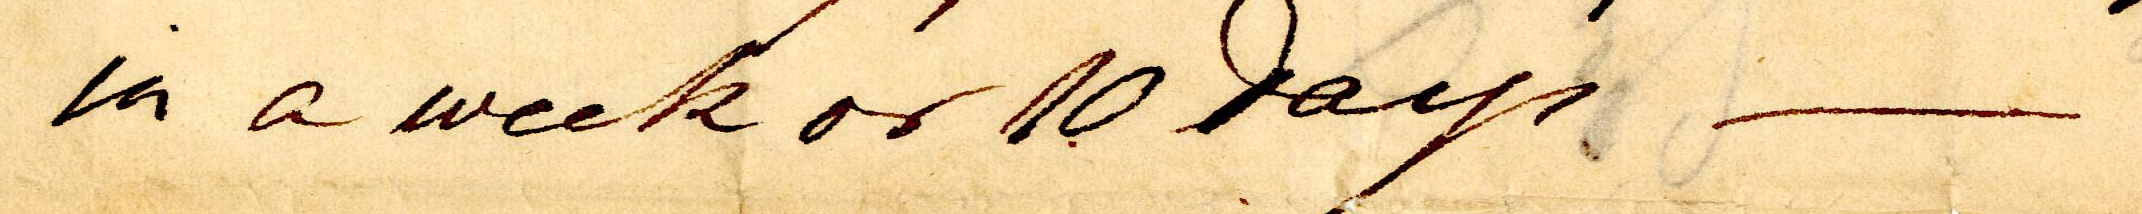in a week or 10 days-
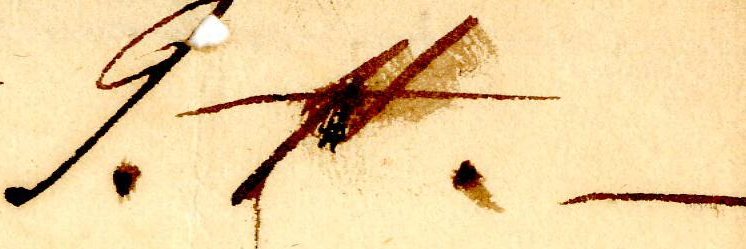J.H.-
